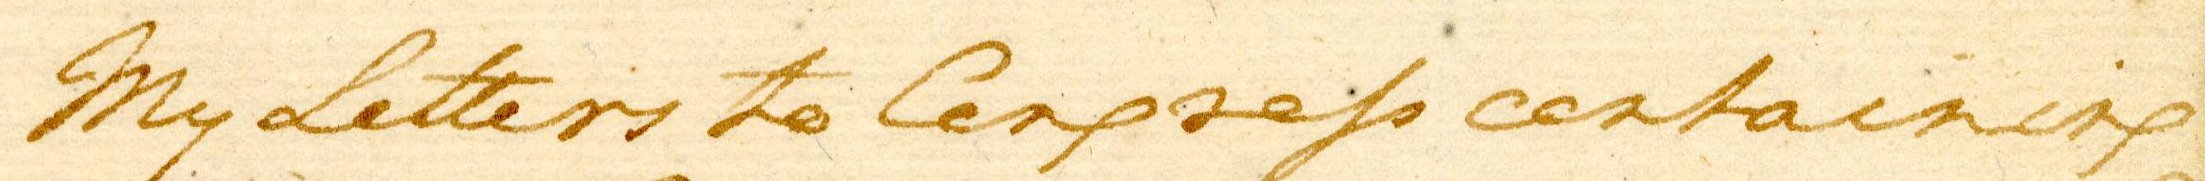My Letters to Congress containing
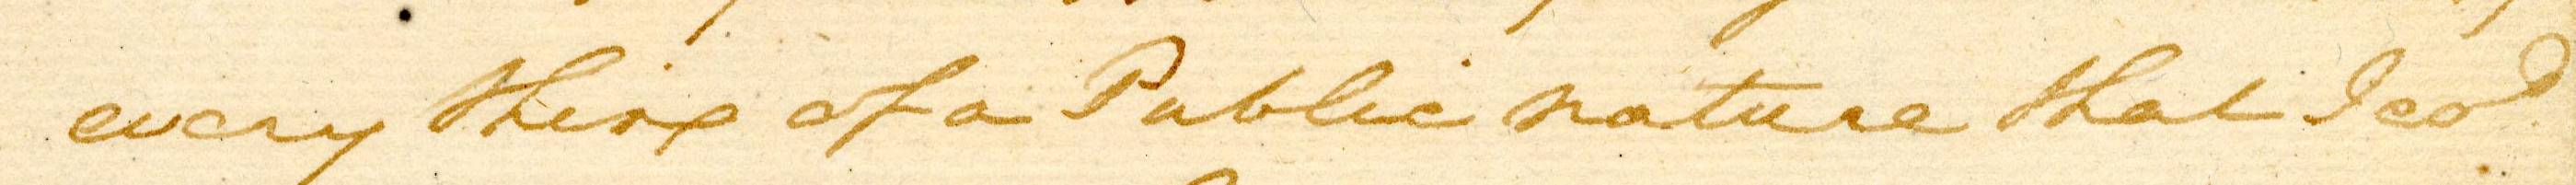every thing of a Public nature that I co^d
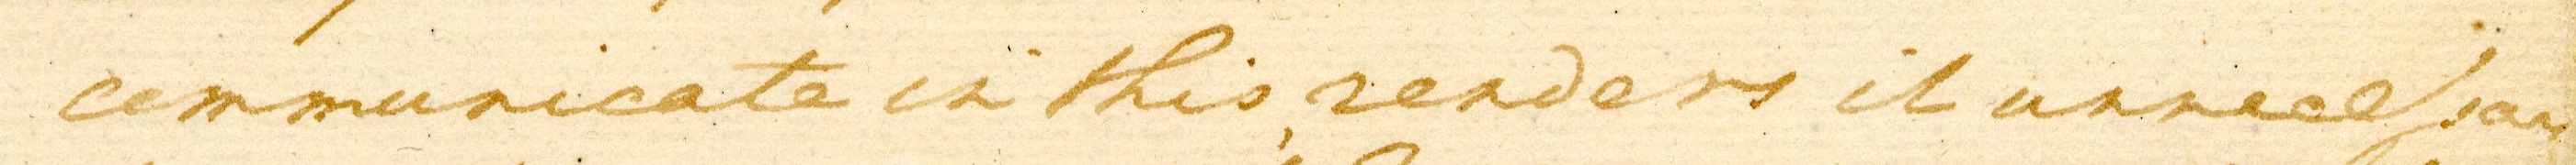communicate in this renders it unnecessay
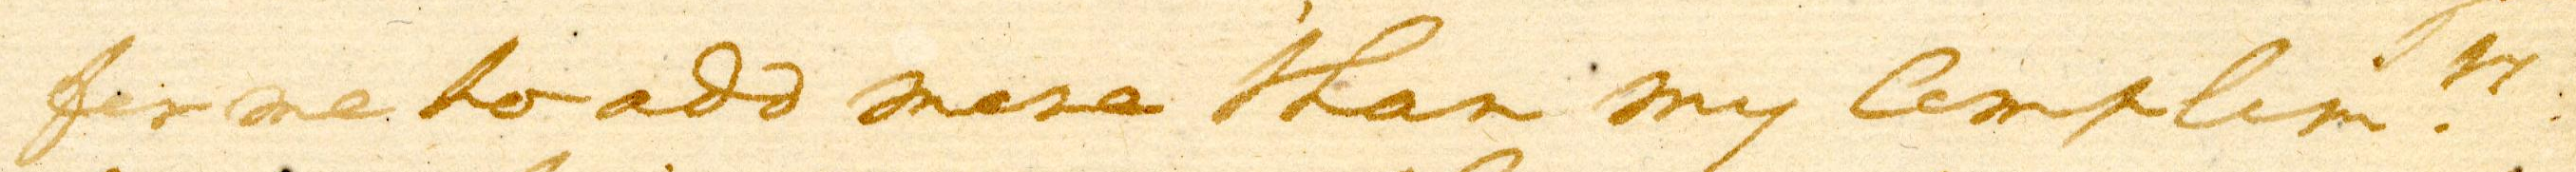for me to add more than my Complim^ts.
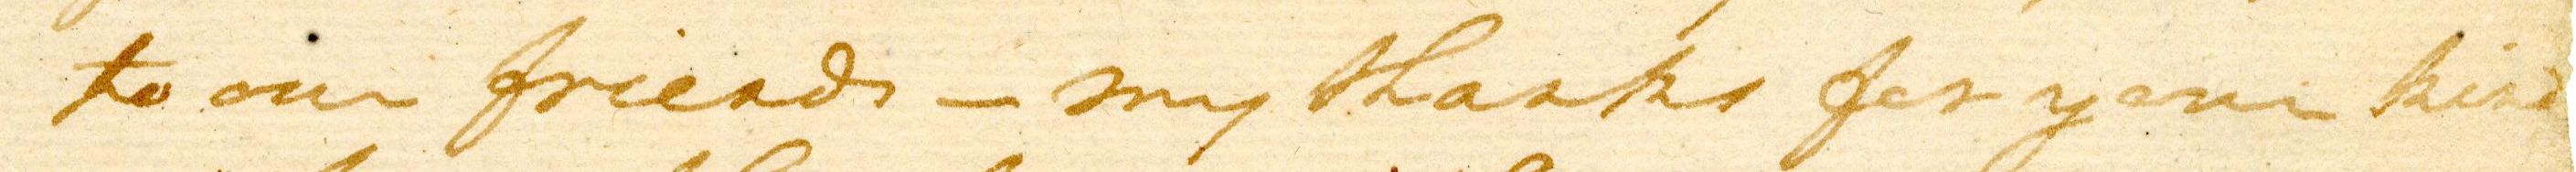to our friends- my thanks for your kind
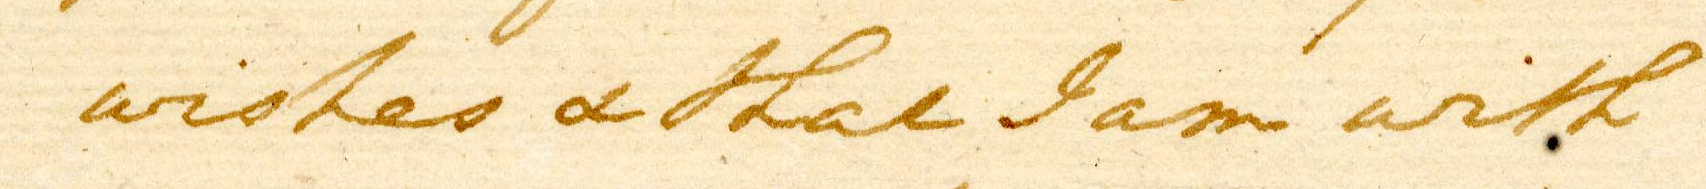wishes & that I am with
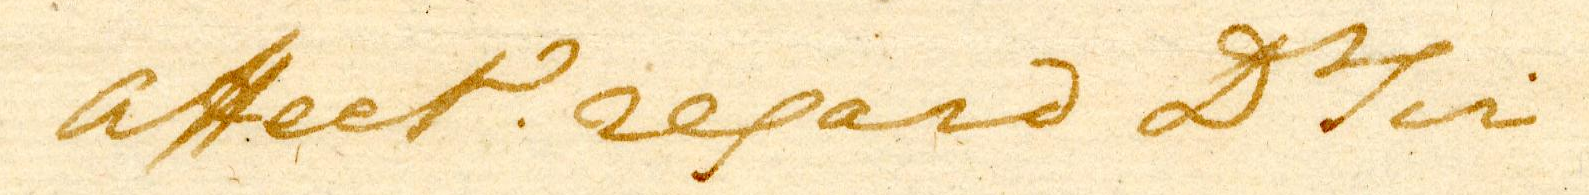affect. regard D^r Sir
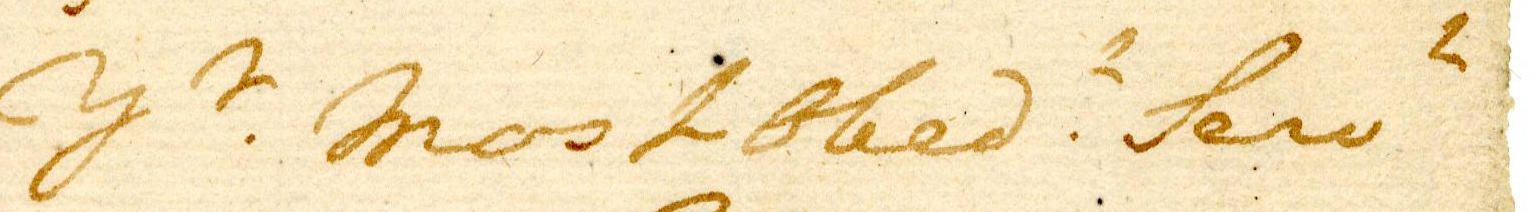y^r. Most Obed^t. Serv^t
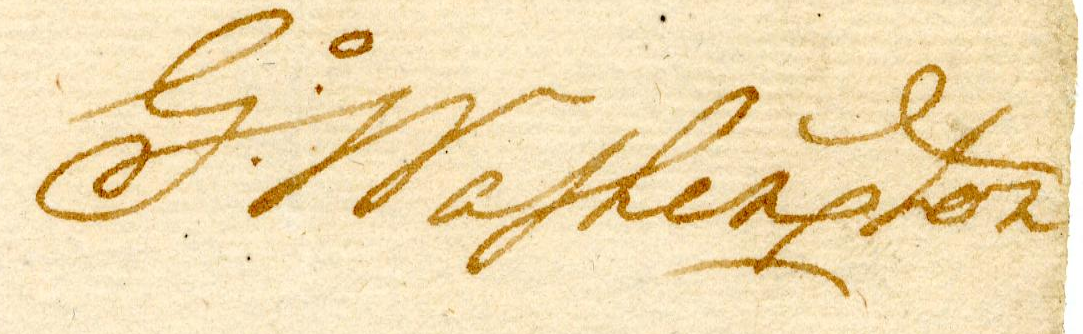G^o: Washington
